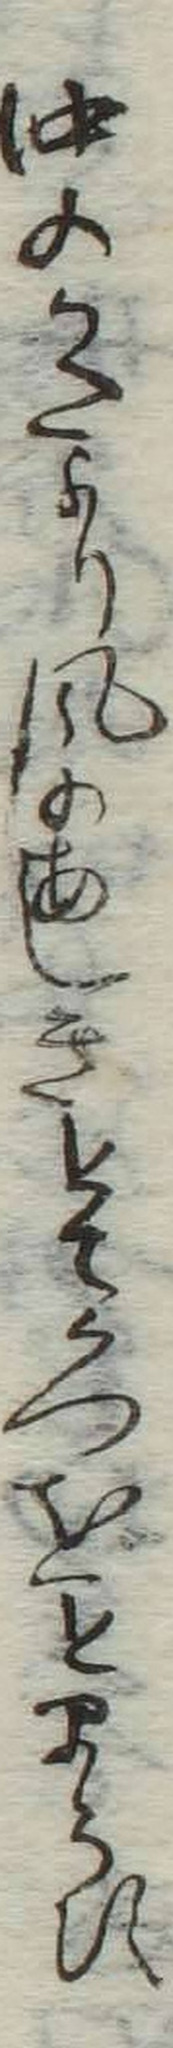沖のかたより風のあしきとてかつをとまうす
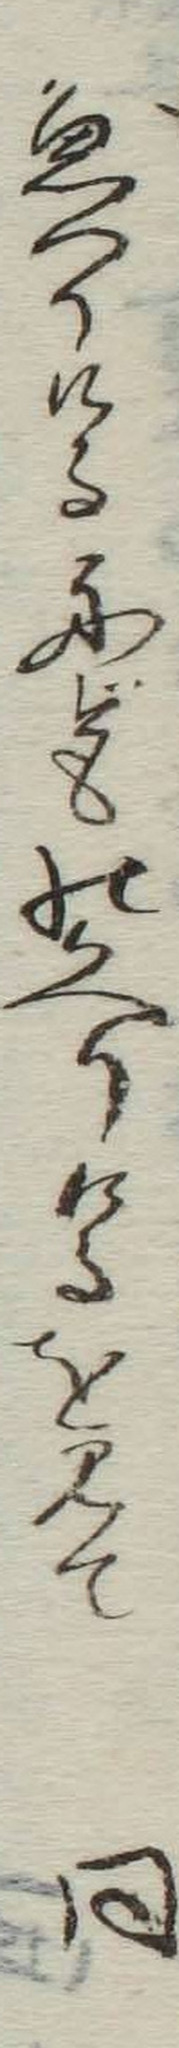魚つりける舟どものかへりけるを見て同
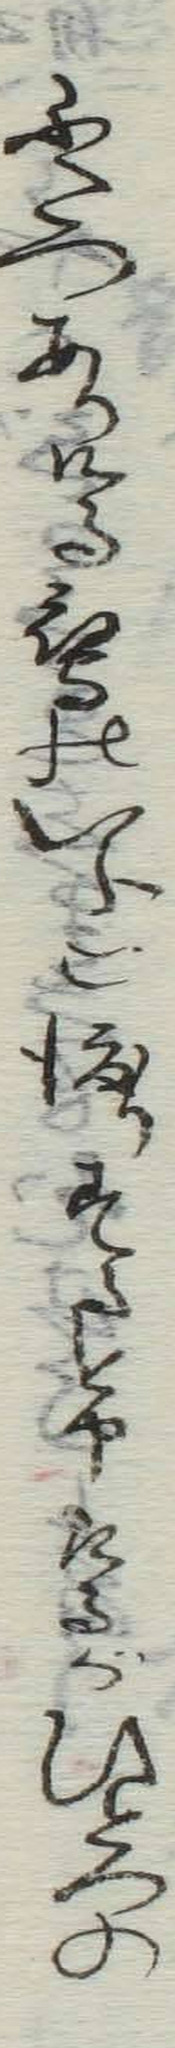ふたつありける鷹のいらご渡りすると申けるがひとつの
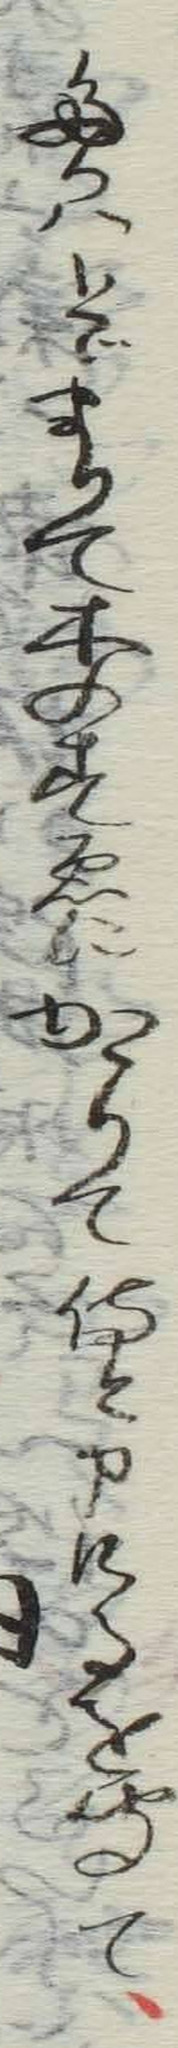たかはとゞまりて木のすゑにかゝりて侍と申けるを聞て、
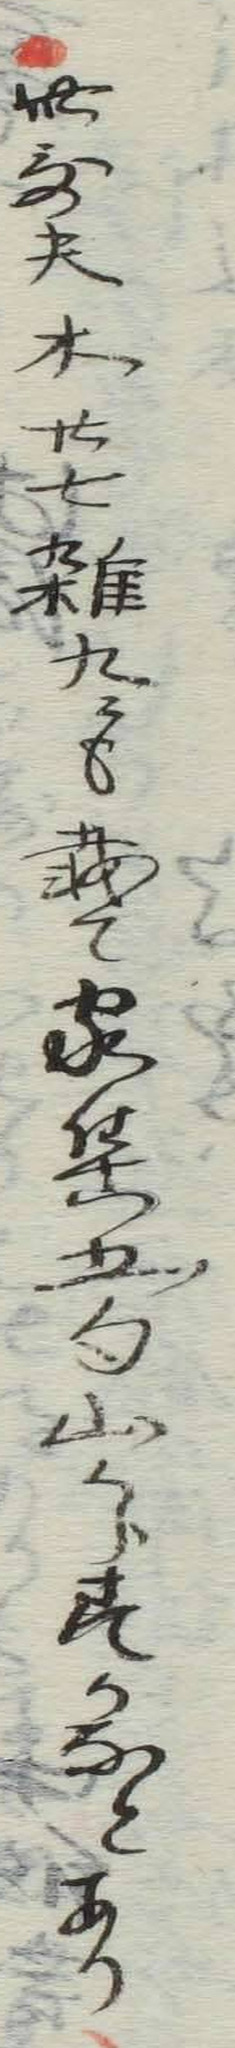●此歌夫木廿七雑九ニも載て家集五句山からすかなとあり、
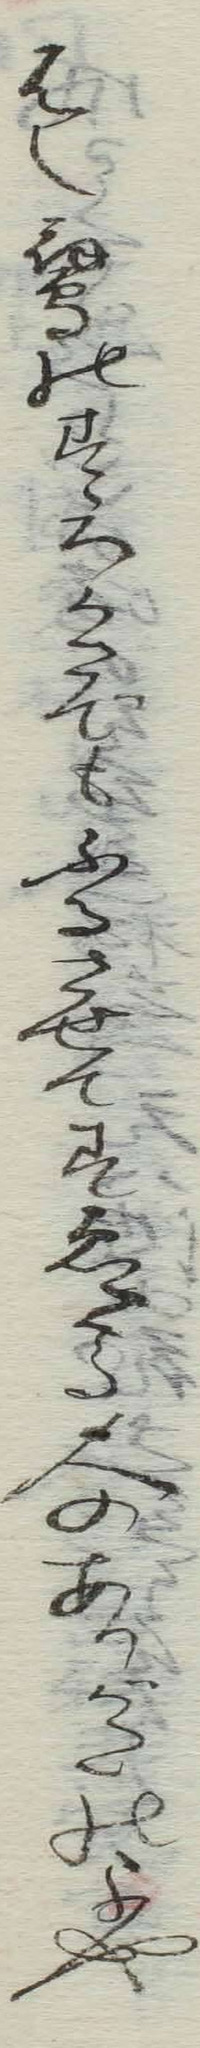はし鷹のすゝろかさでもふるさせてすゑたる人のありがたのよや
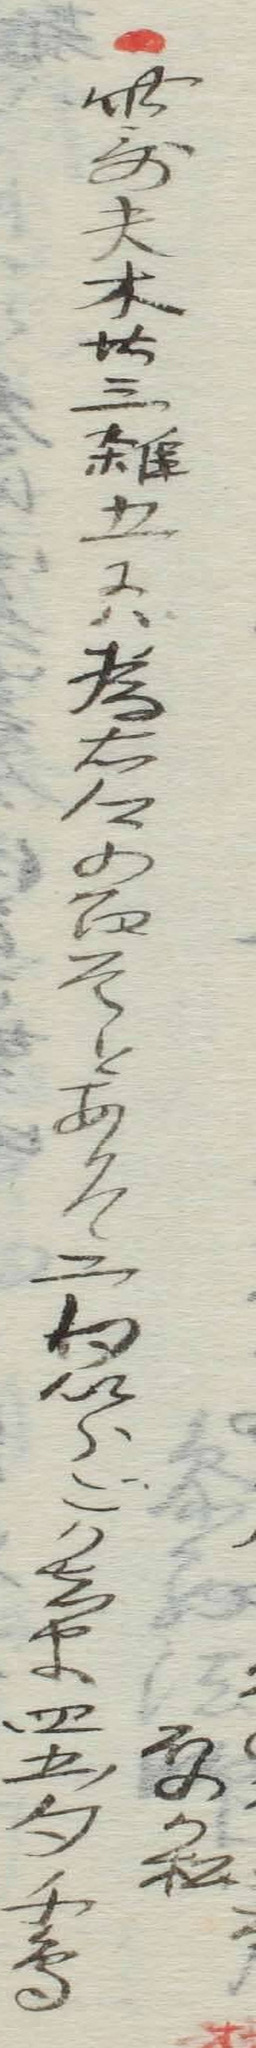●此歌夫木廿三雑五には為忠卿の百首とありて二句いらごかしま四五句千鳥
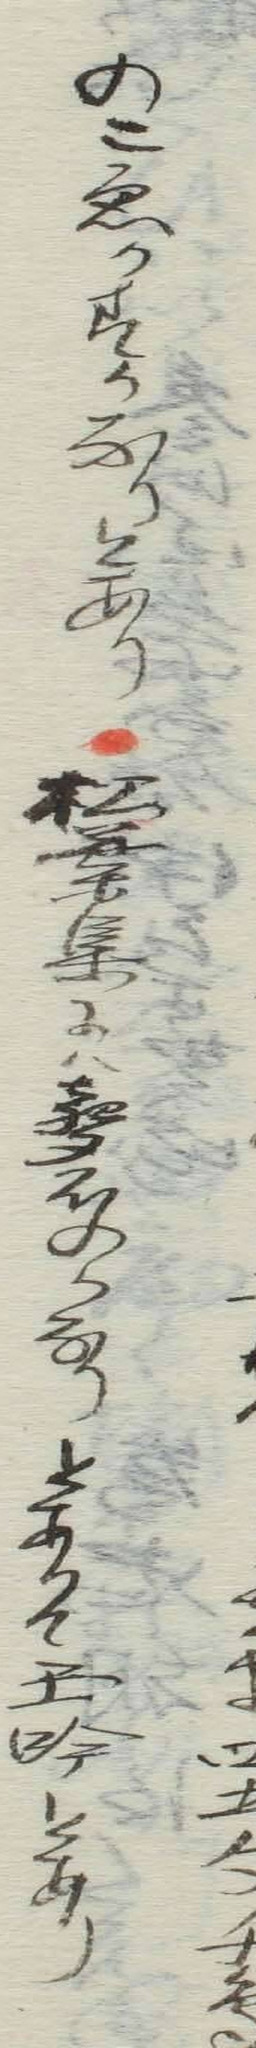のこゑかすかなりとあり●松葉集には声ほのかなりとありて玉吟とあり
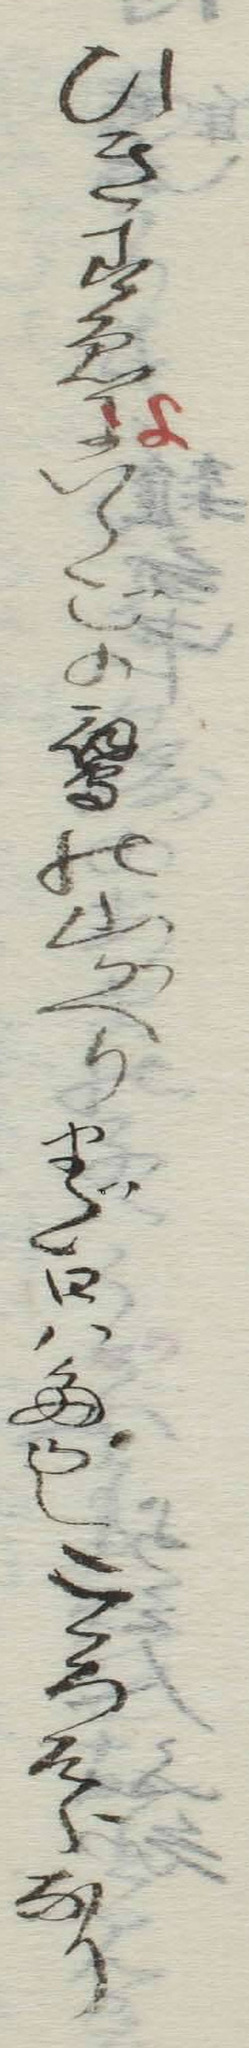ひきすえよいらこの鷹の山がへりまだ日はたかしこゝろそらなり白モ
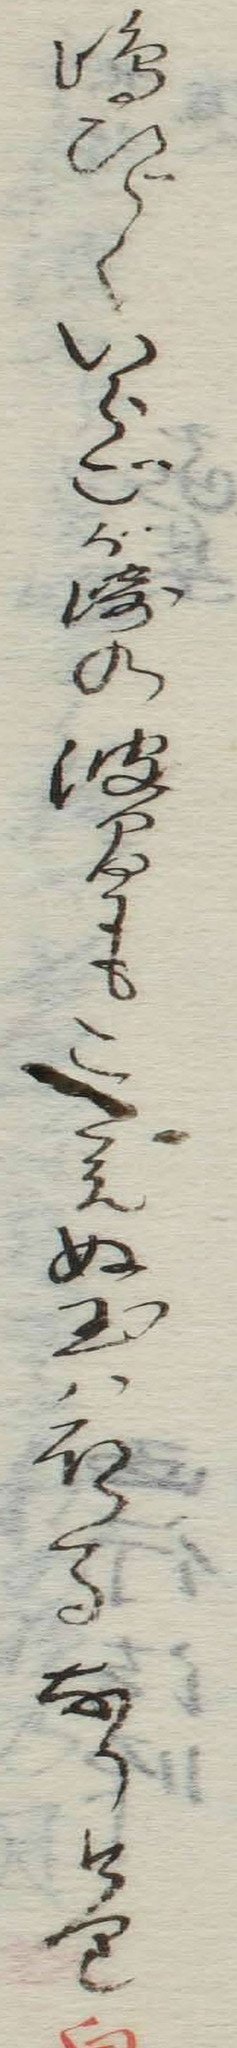島ひゞくいらごが崎の波間にもこたえぬ玉はほたるなりけり白
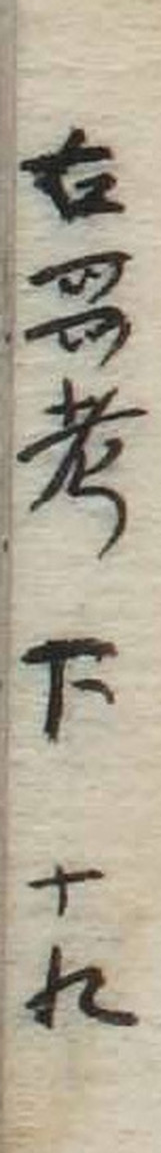古歌考下十九

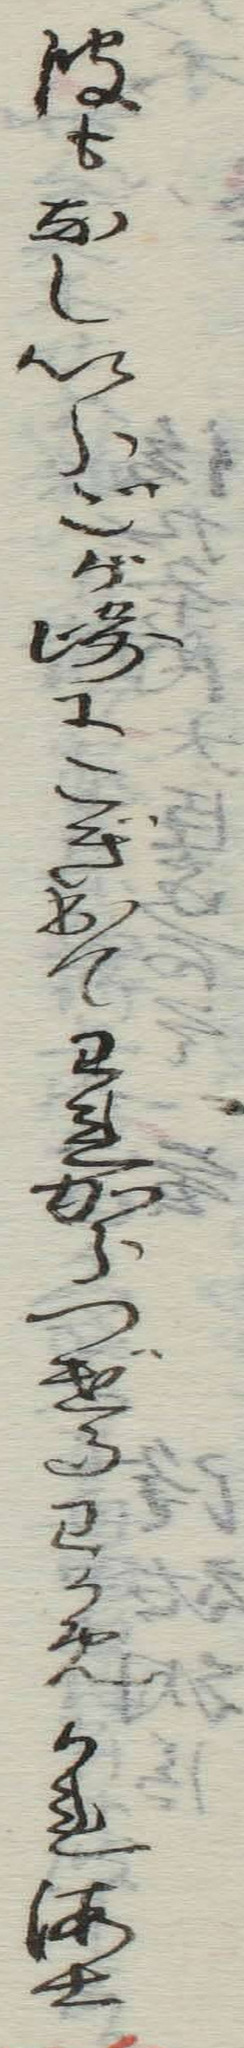浪もなしいらごが崎にこぎ出てわれからつげるわかめかれ海士白松
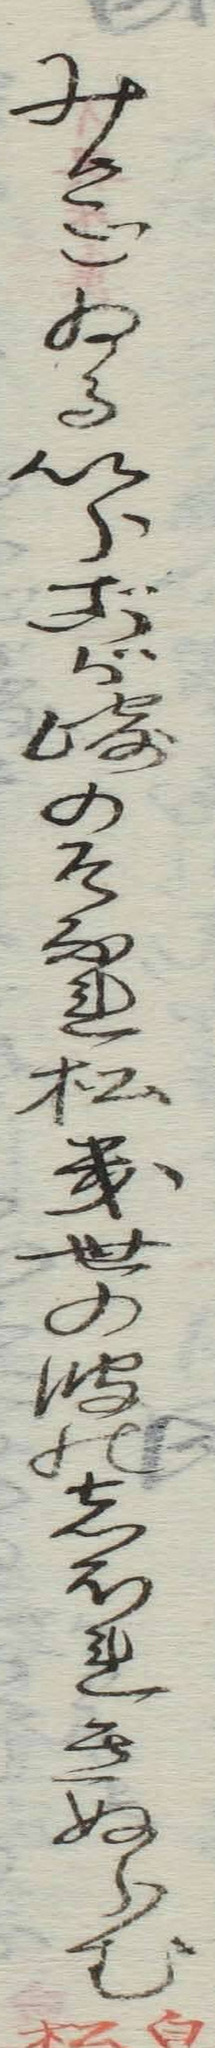みさごゐるいらごが崎のはなれ松幾世の波のしほれきぬらむ白松
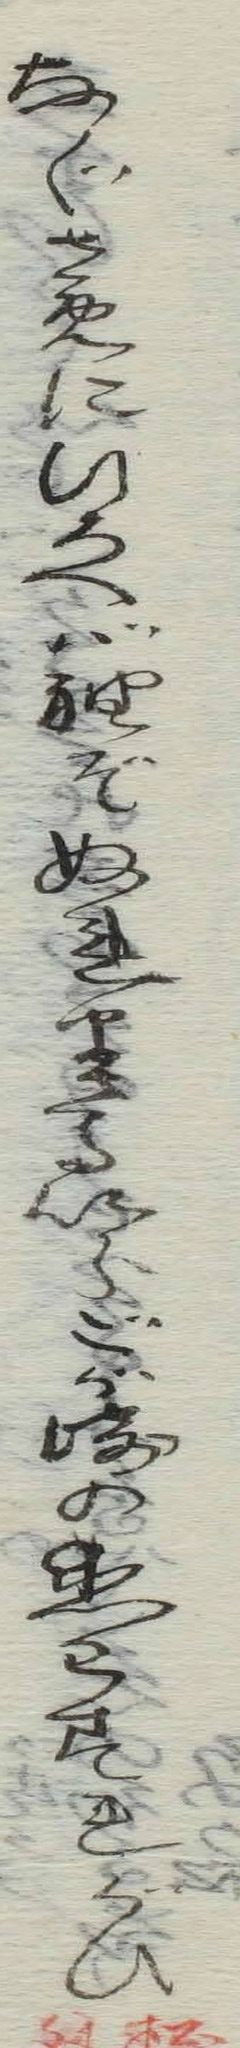なぐさめにひろへば袖ぞぬれまさるいらごが崎の恋わすれがひ松外
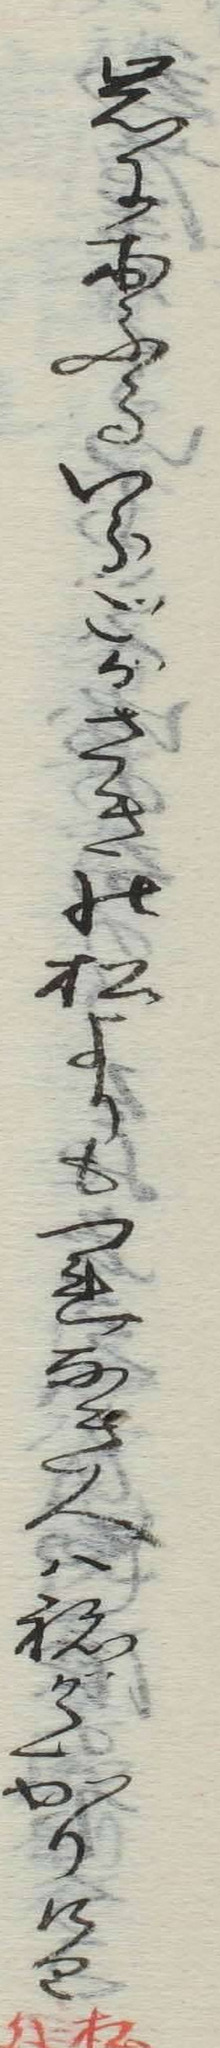岩におふるいらごかさきの松よりもつれなき人はねがたがりけり松外
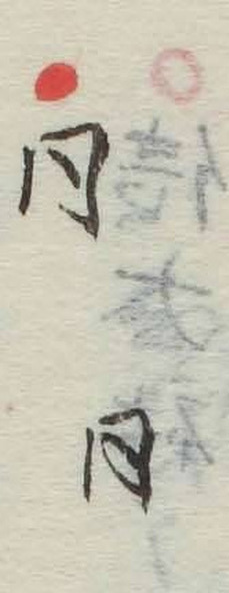●同同
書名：三河国古跡考
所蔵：国文学研究資料館
